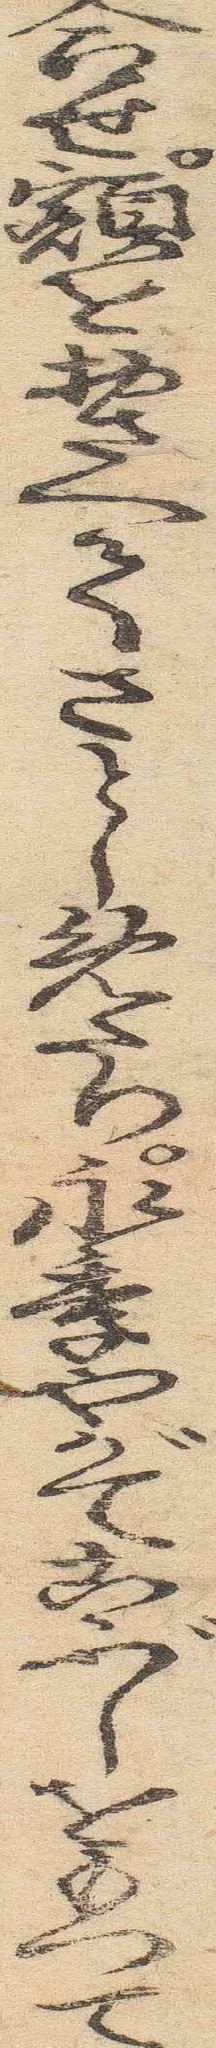合せ。額をおさへてさとしめたり。永季やがてこぶしをもつて
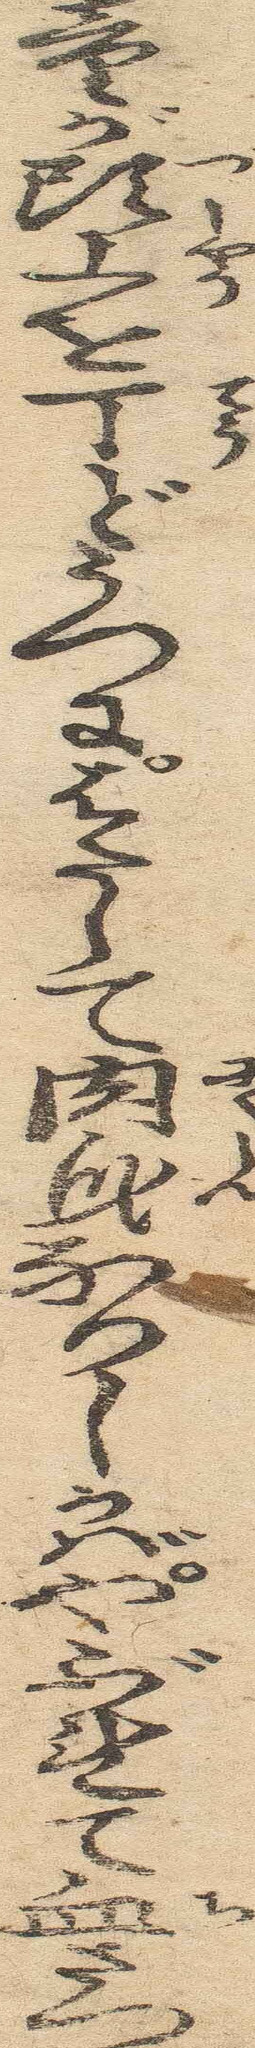童が頭上を丁どうつに。はたして肉身なりしかば。やぶれて血さつ
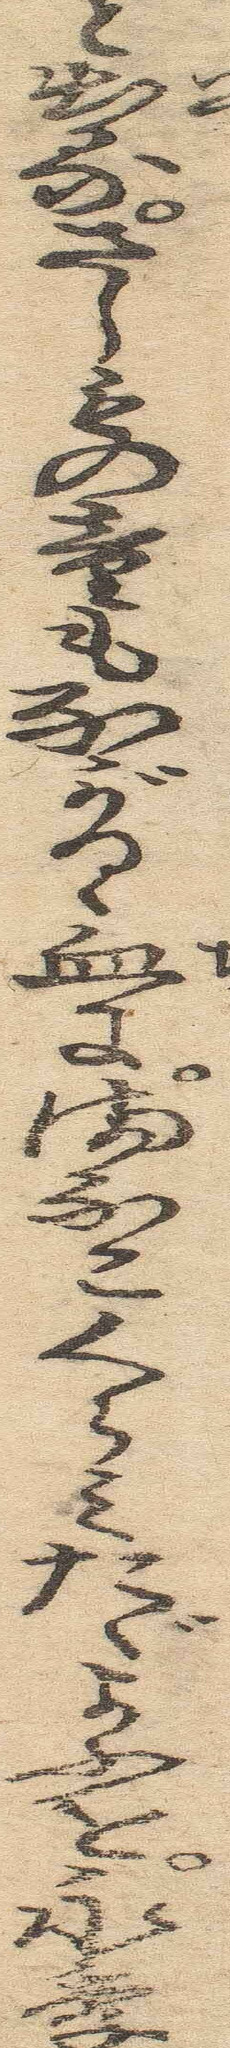と出る。さしもの童もながるゝ血にまなこくらみたゞよふを永季
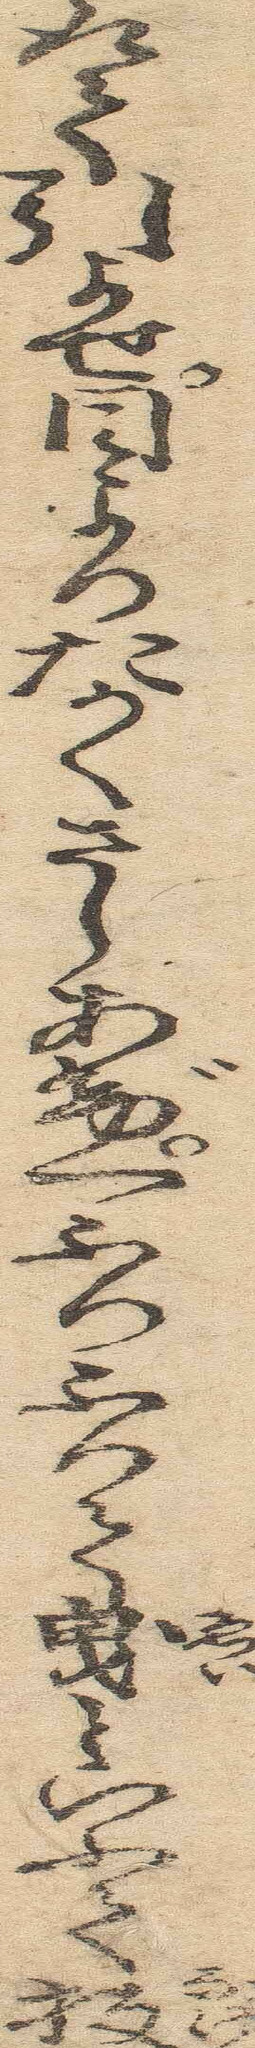取て引よせ。目よりたかくさしあげ。一ふりふりて曳といふて投
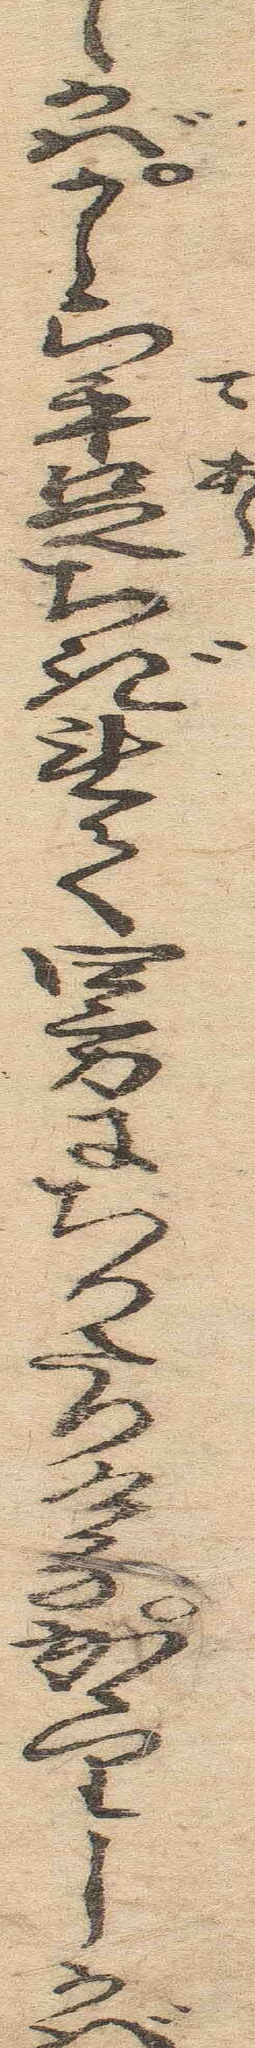しかば。かしら手足ちぎれて四方にちりたるける。かゝりしかば
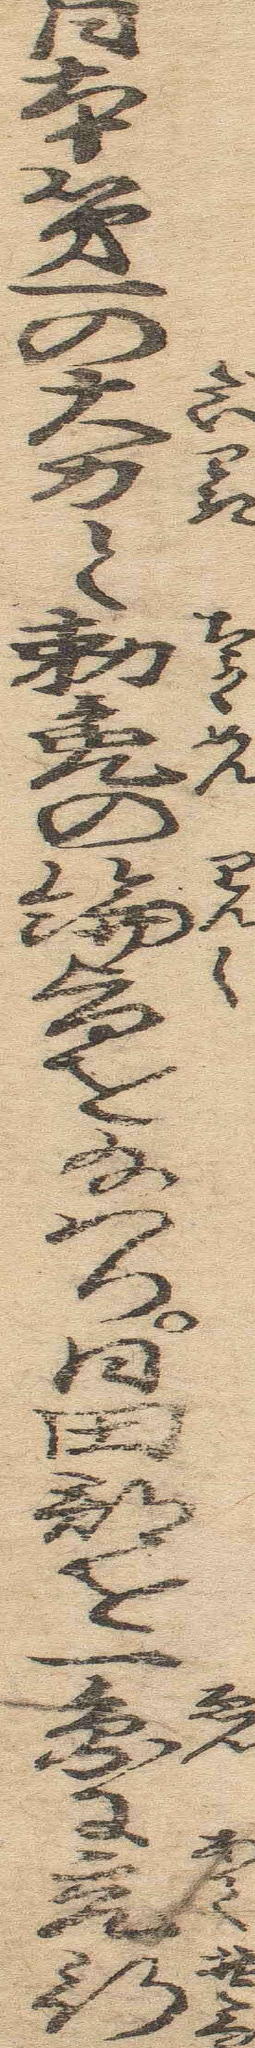日本第一の大力と勅免の綸旨を給はり。日田郡を一円に宛行
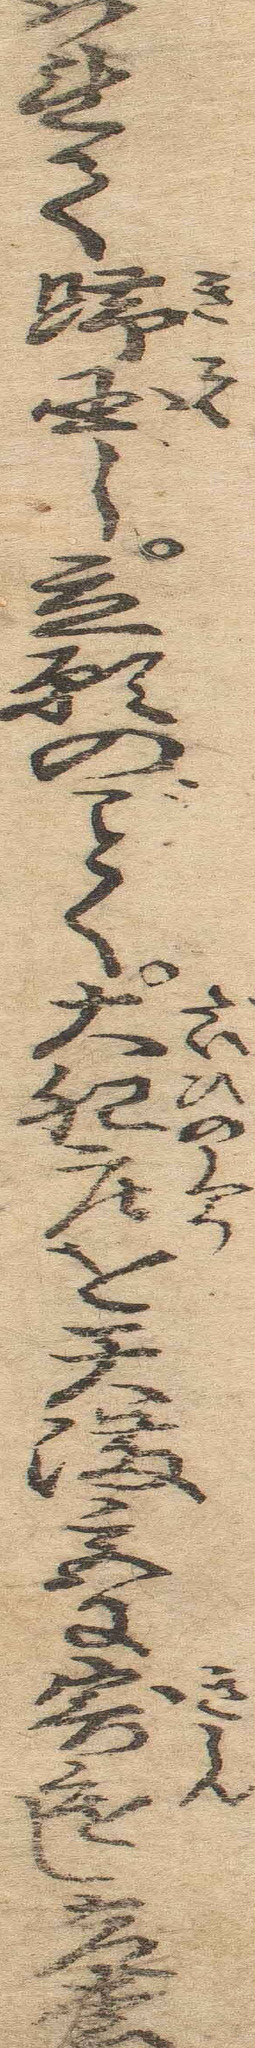はれて帰国し。立願のごとく。大肥庄を天満宮に寄進し老松
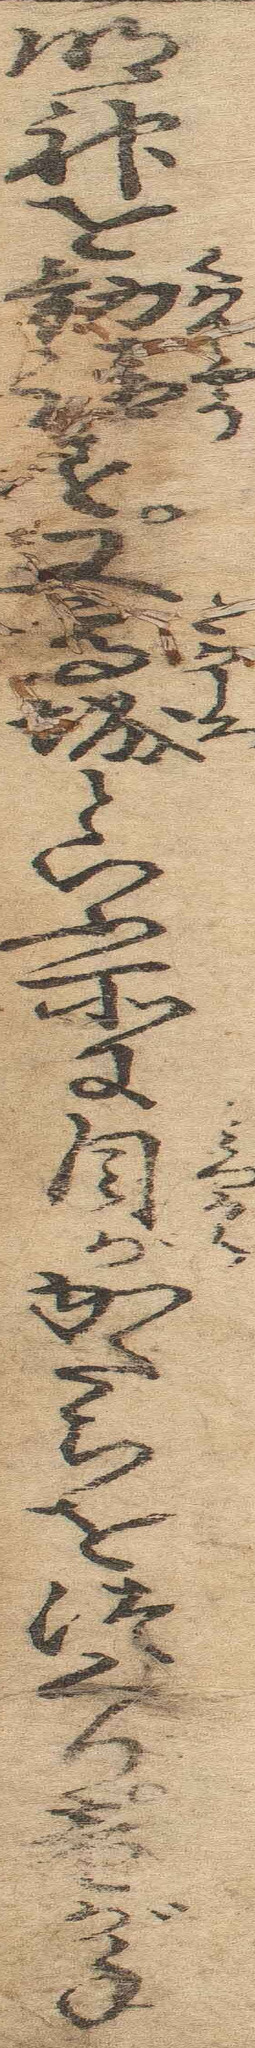明神を勧請す。又高城といふ所に自がかたちをつくり。童が手

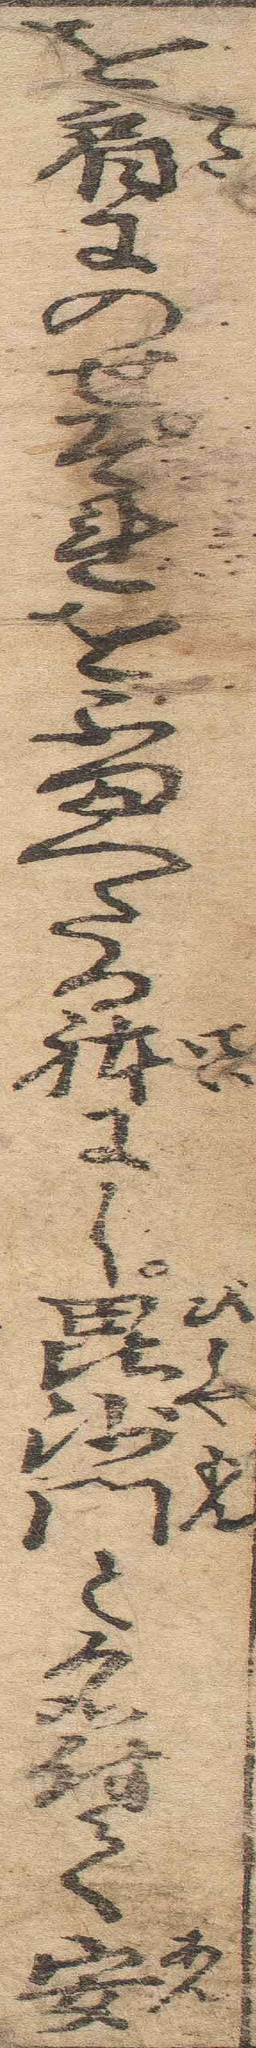を肩にのせ。それをふまへたる体にし。毘沙門と名付て安
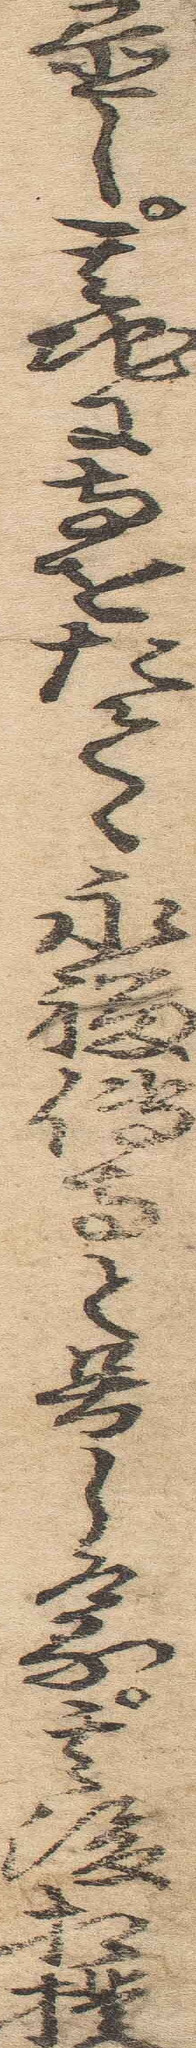置し。其地に寺をたてゝ永福伝寺と号しける。其後相撲
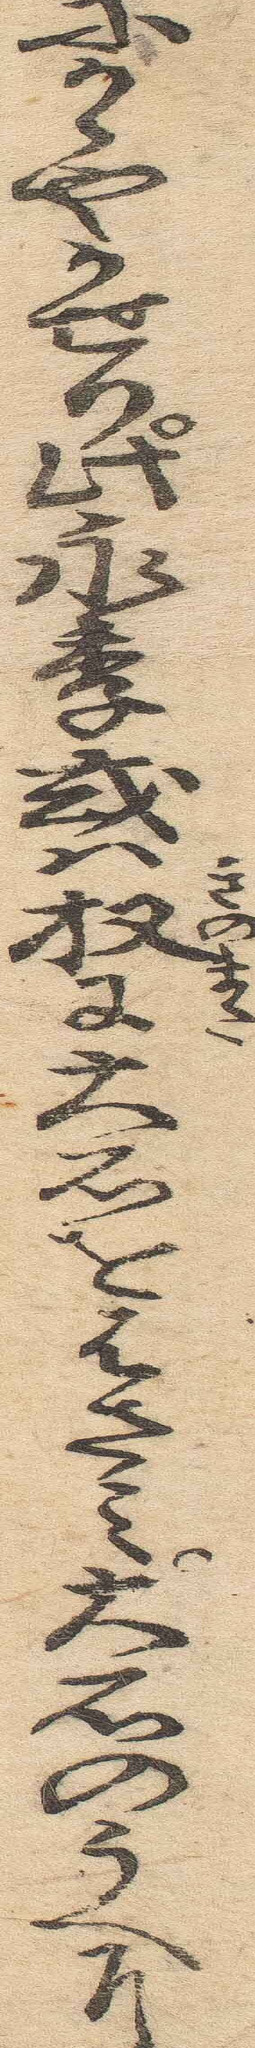にかゝやかせり。此永季或は枝に大石をはさみ。大石のうへに
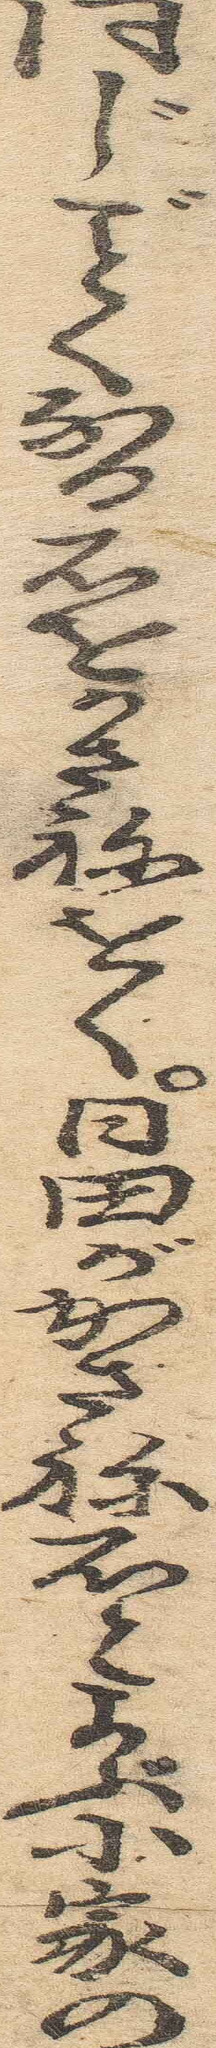同じごとくなり石をかさねをく。日田がかさね石とよぶ小家の
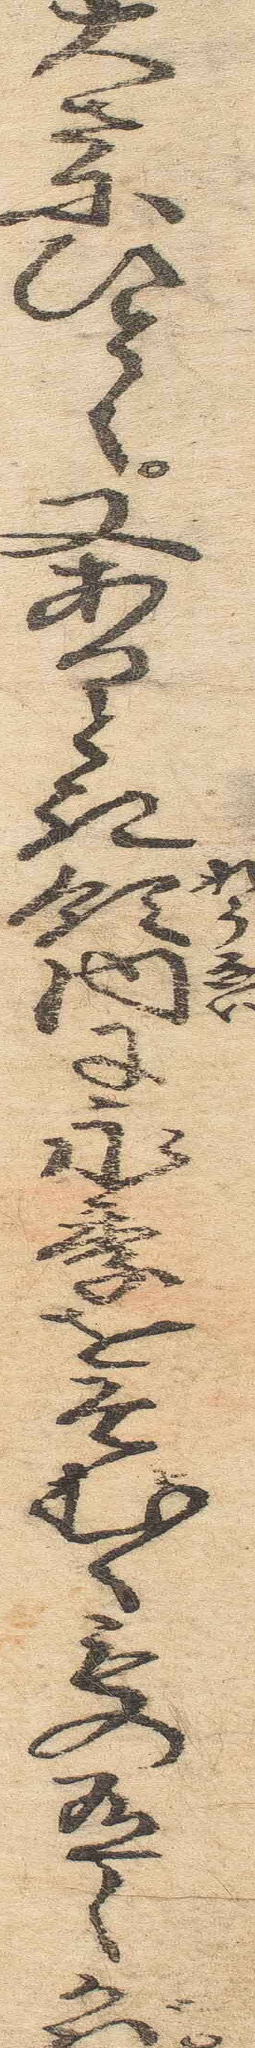大さにひとし。又あるとき領内に永季をそむくもの有しかば。
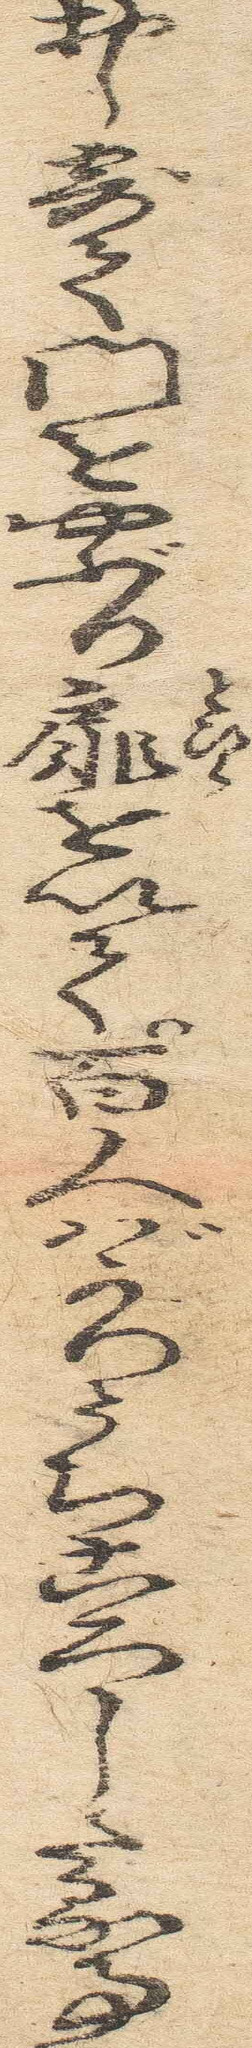おし寄て門をやぶり扉を以て。百人ばかりうちころしたる事
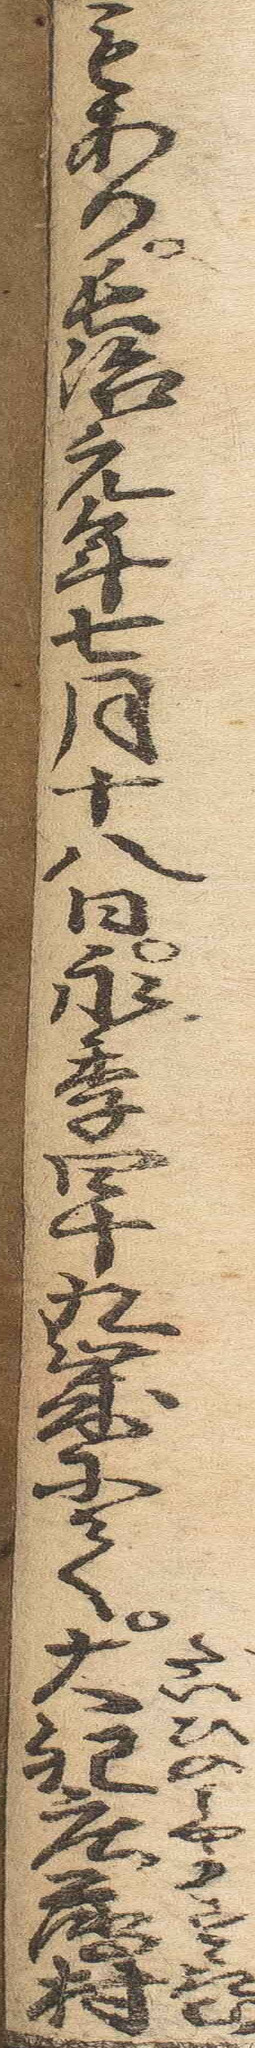もあり。長治元年七月十八日。永季四十九歳にて大肥庄薄村
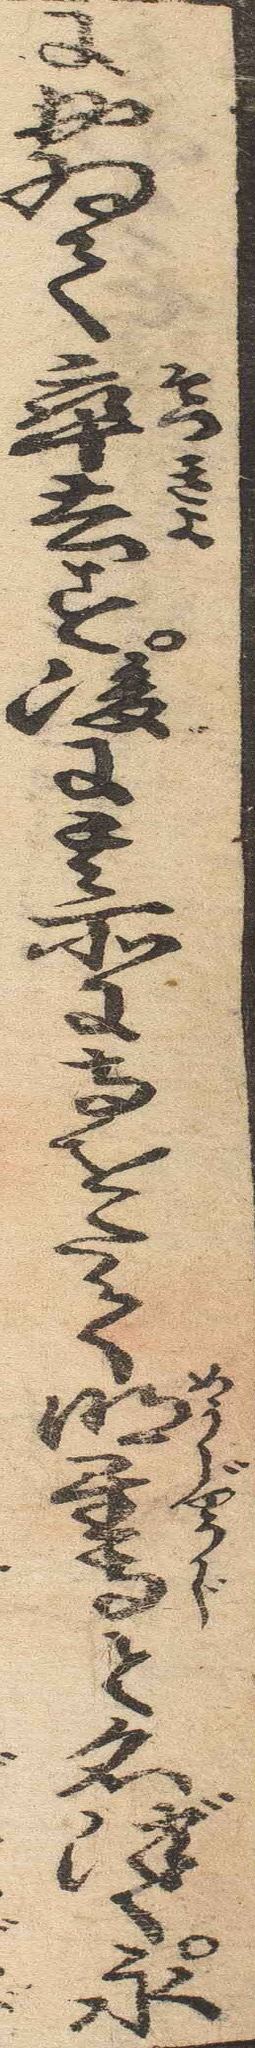におゐて卒去す。後に其所に寺をたて明量寺と名ずく。永
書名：古今相撲大全
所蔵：東京学芸大学附属図書館 国文学研究資料館
